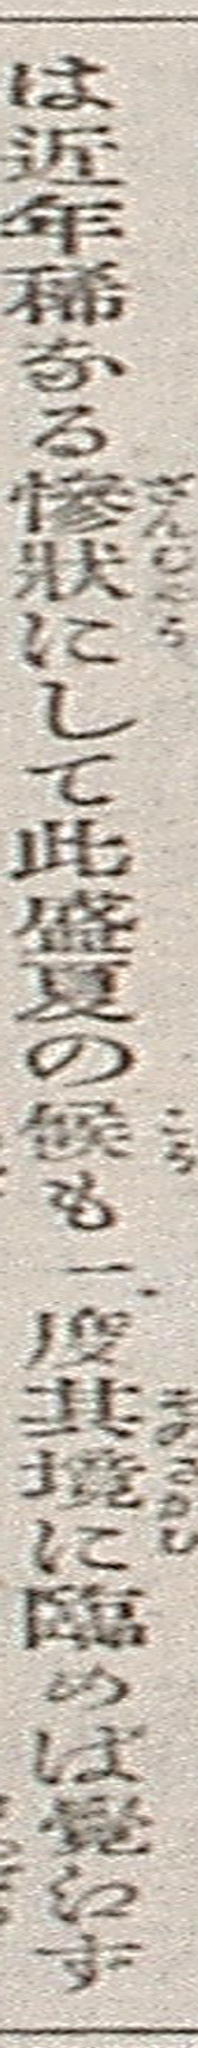は近年稀なる惨状にして此盛夏の候も一度其境に臨めば覚えず
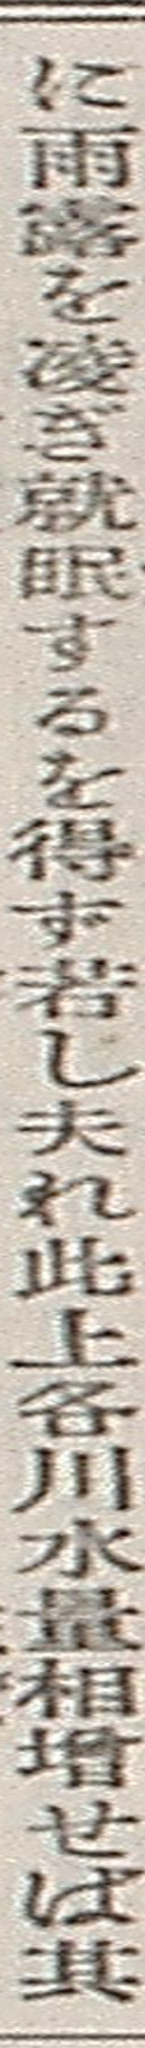に雨露を凌ぎ就眠するを得ず若し夫れ此上各川水量相増せば
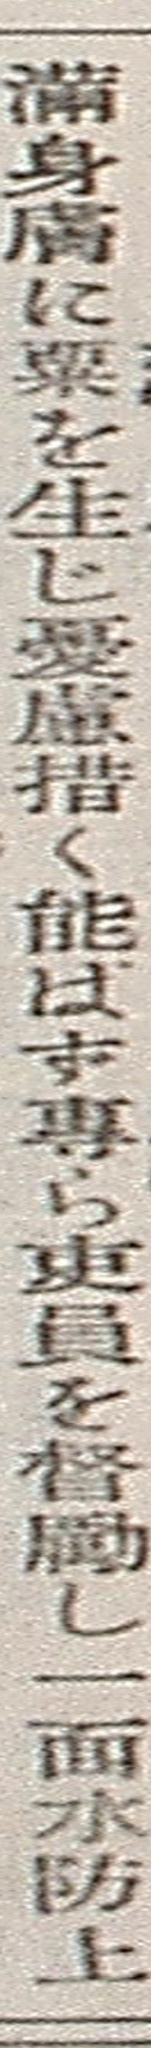満身膚にに粟を生じ憂慮措く能はず専ら吏員を督励し一面水防上
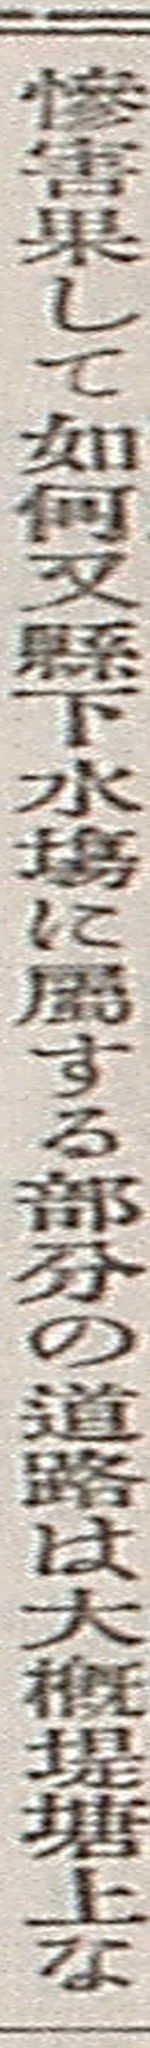惨害果して如何又県下水場に属せる部分の道路は大概堤塘上な
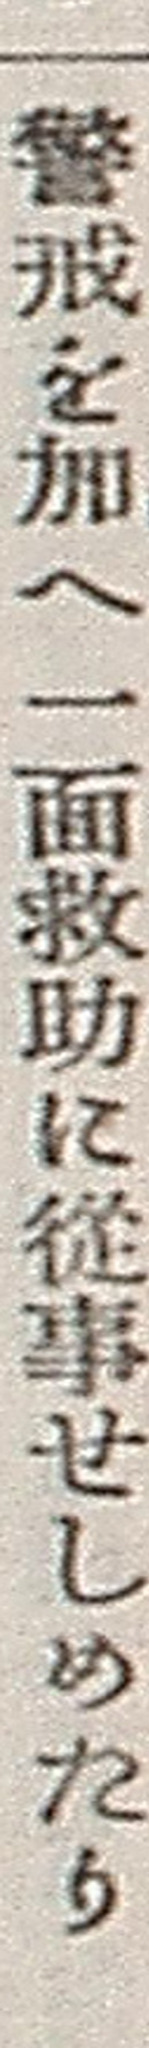警戒を加へ一面救助に従事せしめたり

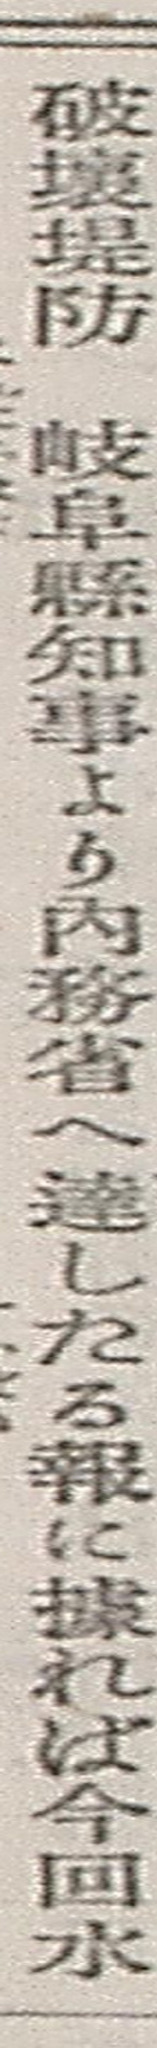破壊堤防岐阜県知事より内務省へ達したる報に據れば今回水
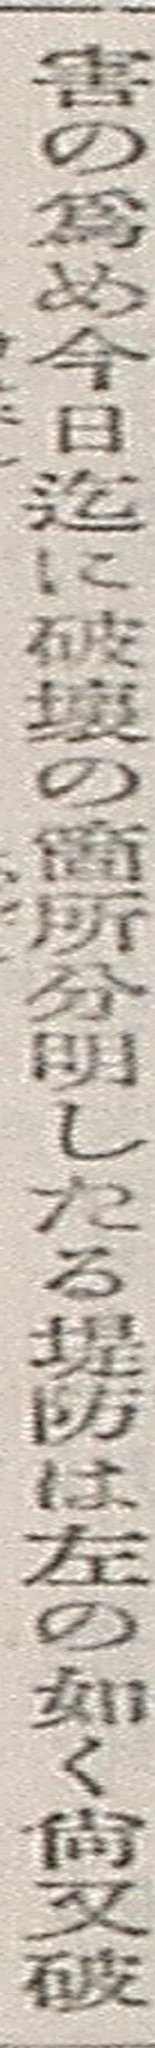害の為め今日迄に破壊の箇所分明したる堤防は左の如く尚又破
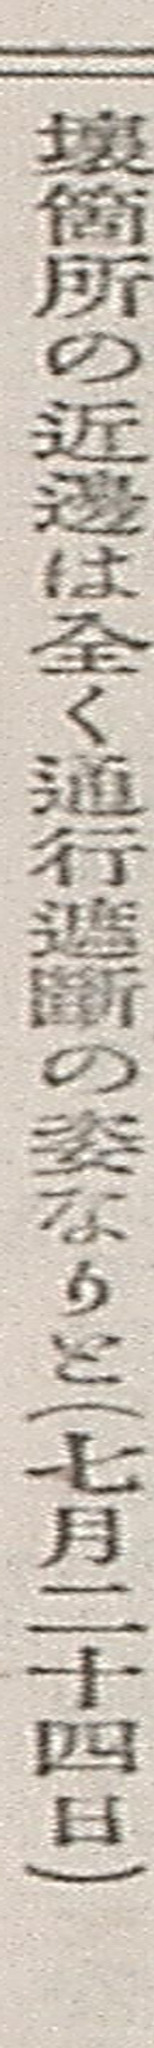壊箇所の近辺は全く通行遮断の姿なりと
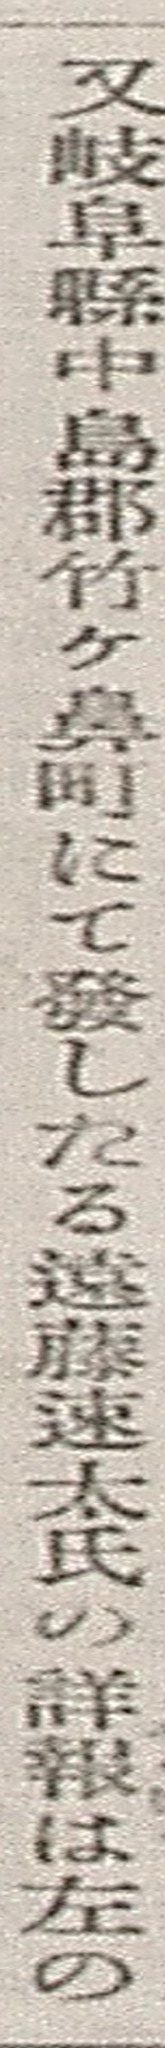又岐阜県中島郡竹ヶ鼻町にて発したる遠藤速太氏の詳報は左の
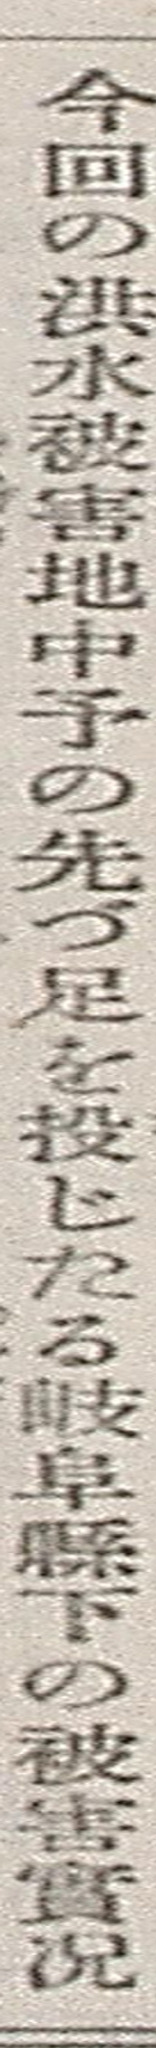今回の洪水被害地中予の先づ足を投じたる岐阜県下の被害実況
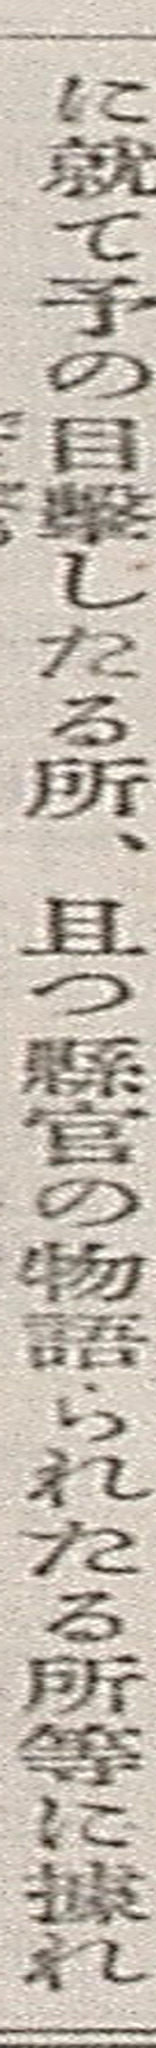に就て予の目撃したる所、且つ縣官の物語られたる所等に據れ
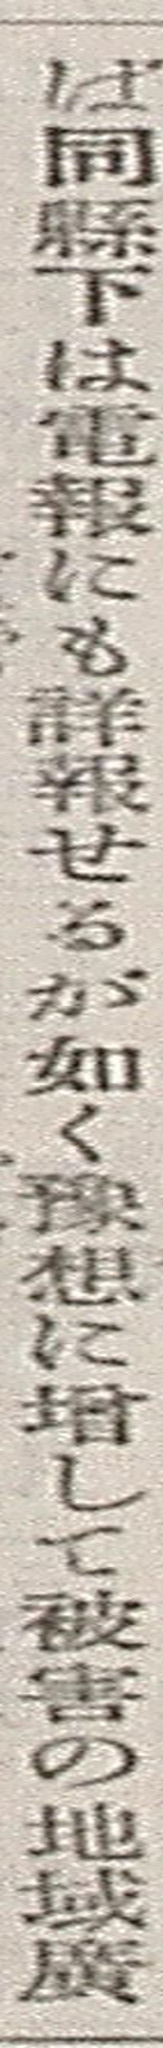ば同縣下は電報にも詳報せるが如く豫想に増して被害の地域廣
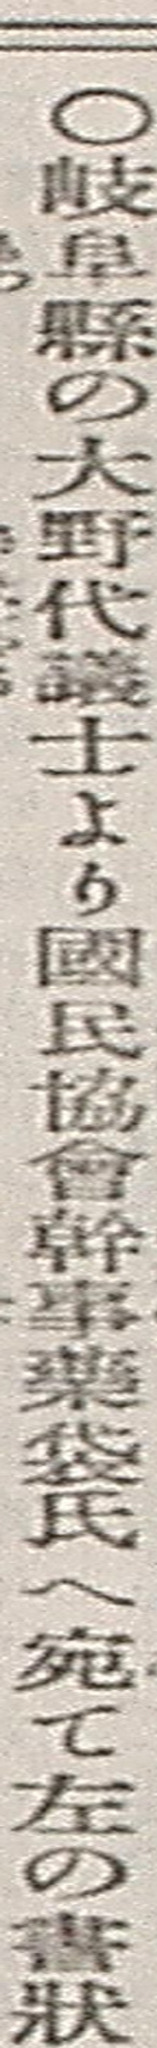◯岐阜県の大野代議士より国民協会幹事薬袋氏へ宛て左の書状
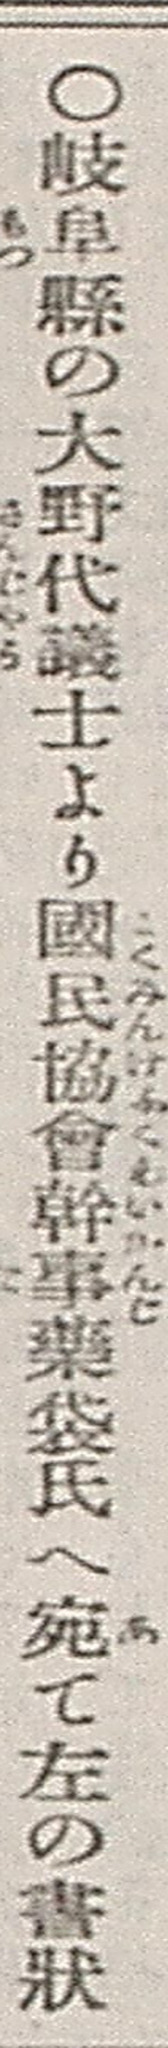◯岐阜県の大野代議士より国民協会幹事薬袋氏へ宛て左の書状
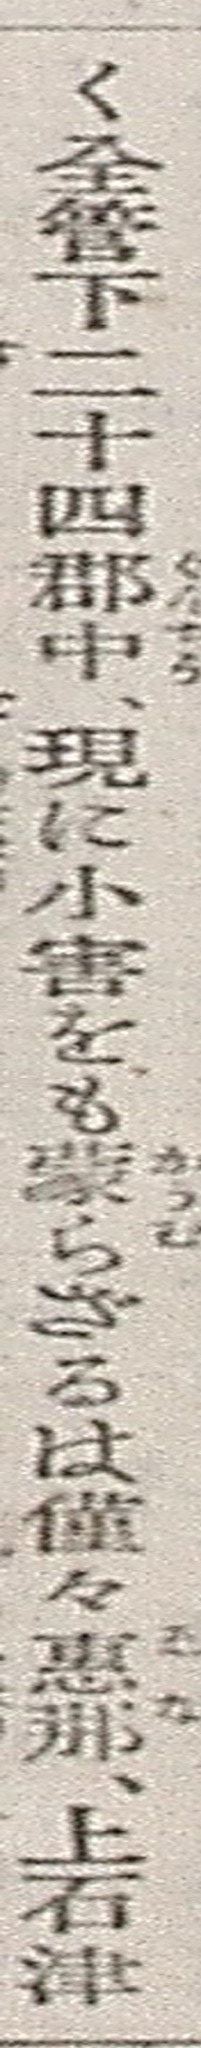く全管下二十四郡中、現に小害をも蒙らざるは僅々恵那、上石津
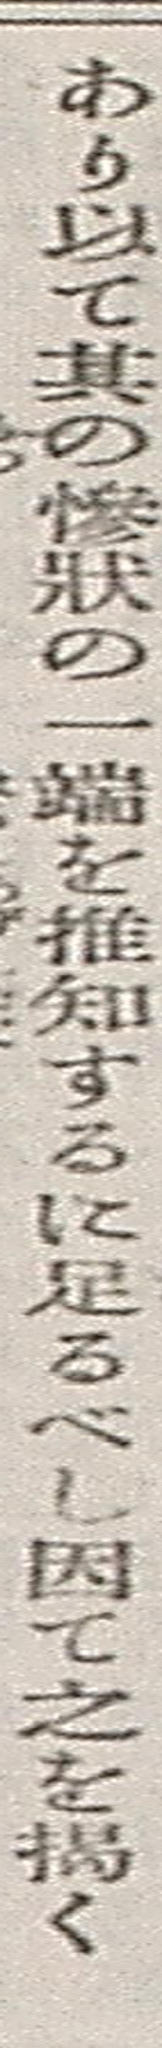あり以て其の惨状の一端を推知するに足るべし因て之を掲ぐ
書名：風俗畫報臨時増刊第百二十六號　洪水被害録（中）
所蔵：東京大学地震研究所図書室 Earthquake Research Institute Library, The University of Tokyo, JAPAN
